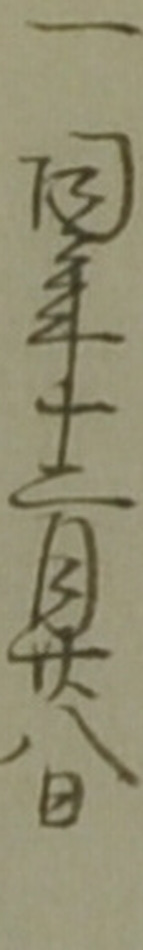一同年十二月廿八日
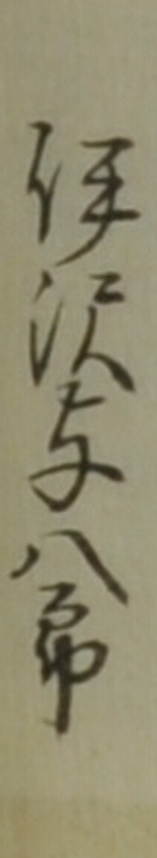伊沢与八郎
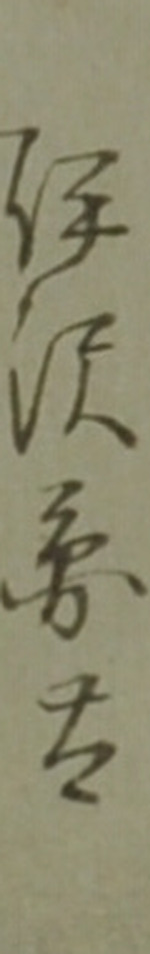伊沢円太

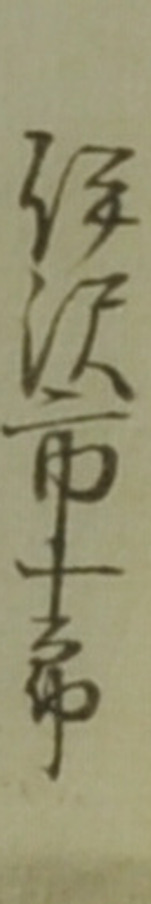伊沢市十郎
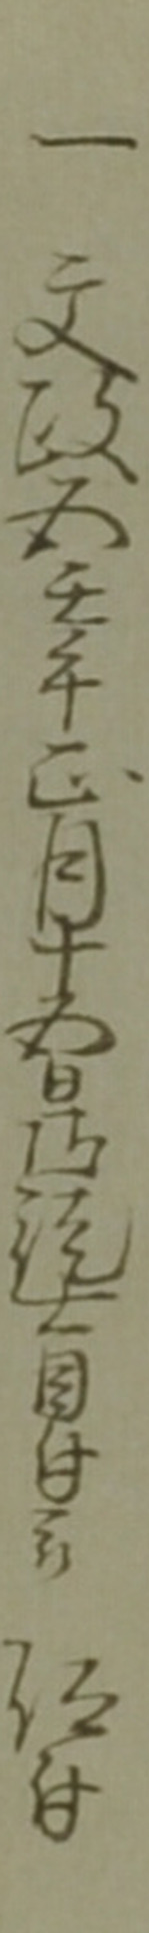一文政五壬午正月十五日御徒士目付被仰付
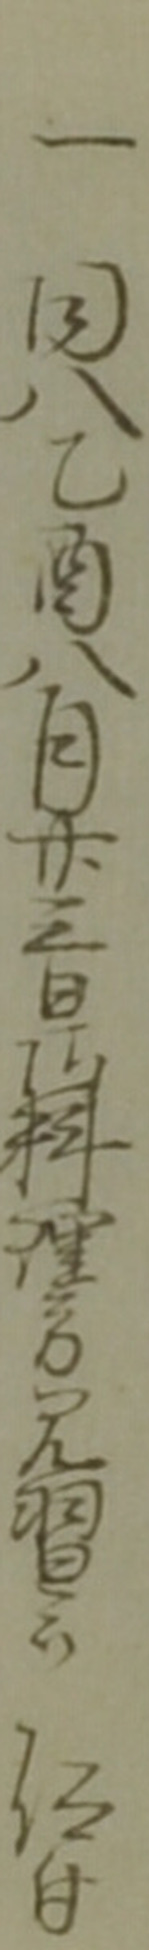一同八乙酉八月廿三日御料理方見習被仰付
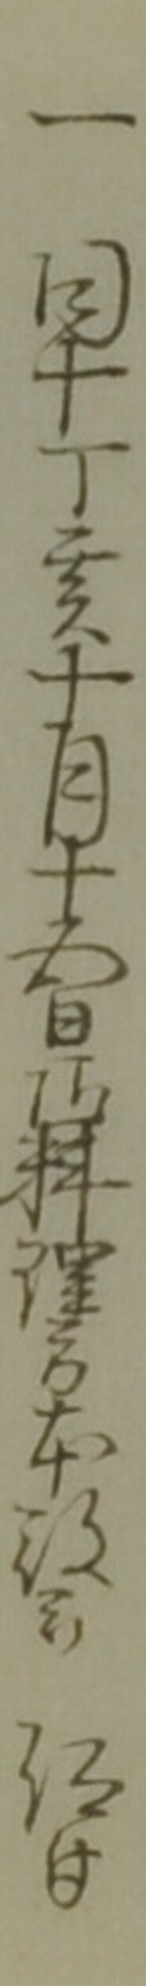一同十丁亥十月十五日御料理方本役被仰付
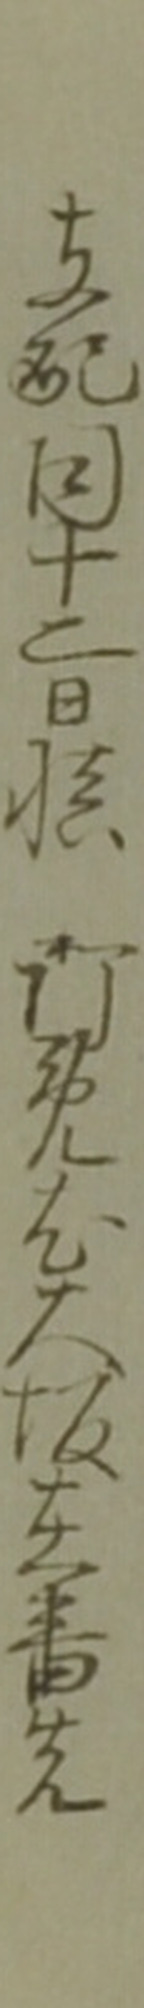支配同十二日慎御免尤大坂在番先
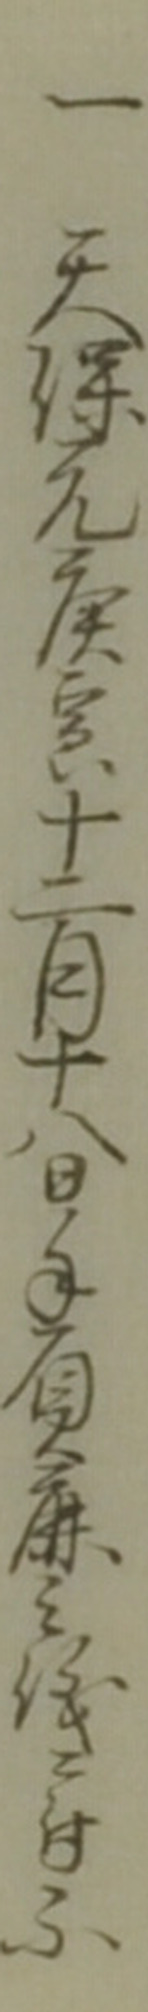一天保元庚寅十二月十八日手負鹿之儀ニ付不
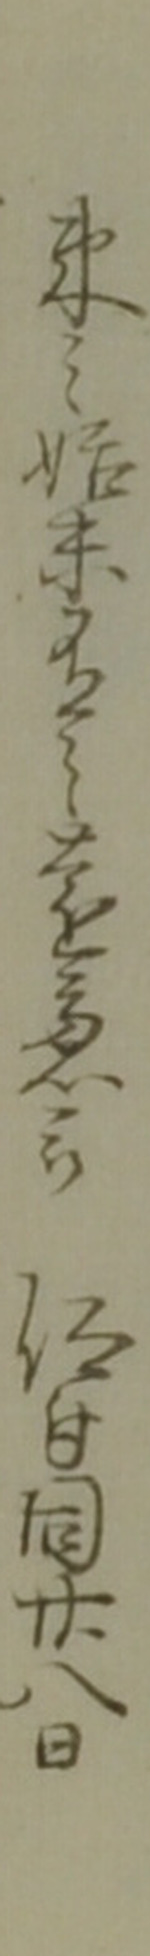束之始末有之遠慮被仰付同廿八日
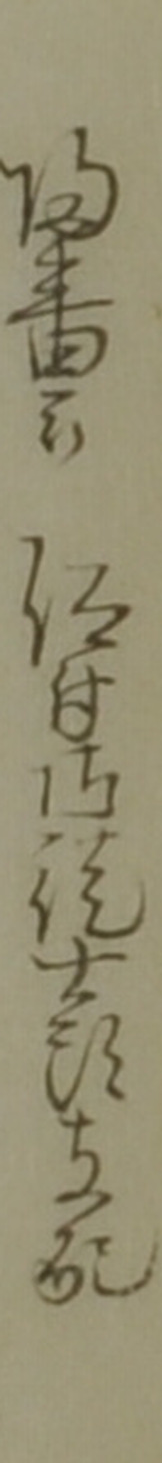帰番被仰付御徒士頭支配
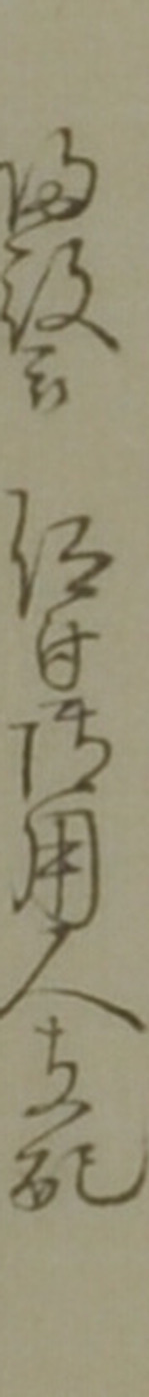帰役被仰付御用人支配
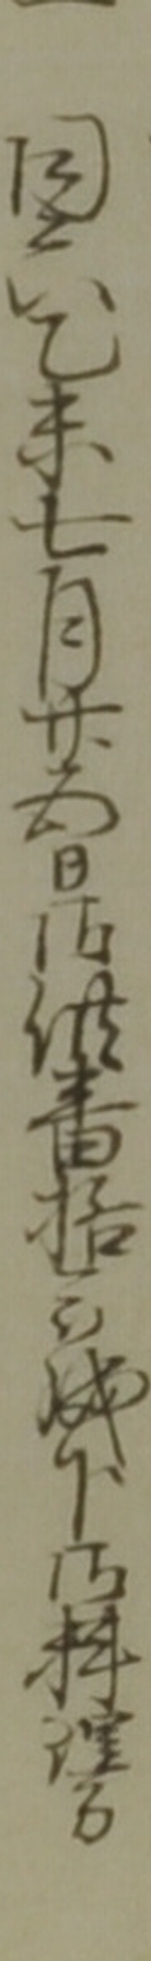一同六乙未七月廿五日御供番格被成下御料理方
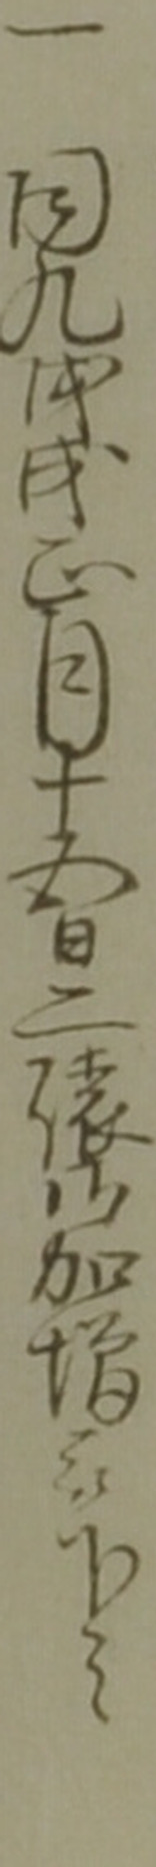一同九戊戌正月十五日二俵御加増被下之
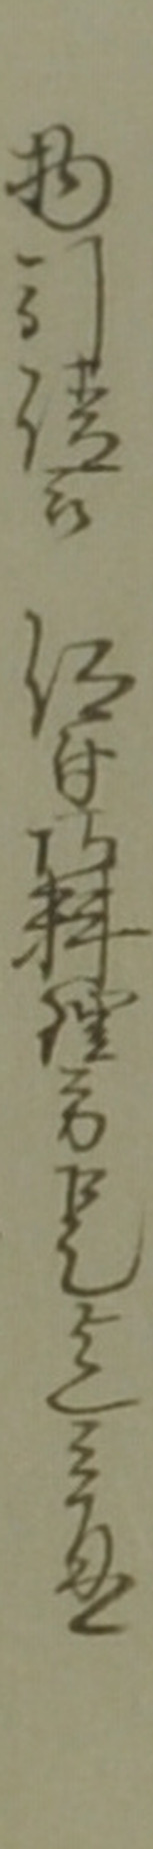物引請被仰付御料理方是迄之通
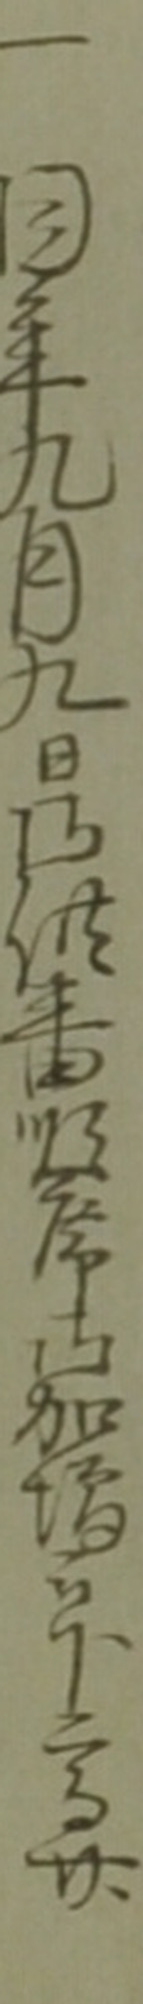一同年九月九日御供番順席御加増被下高廿
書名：無足諸士勤仕録（三）
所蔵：伊那市立高遠町図書館・合同会社AMANE
